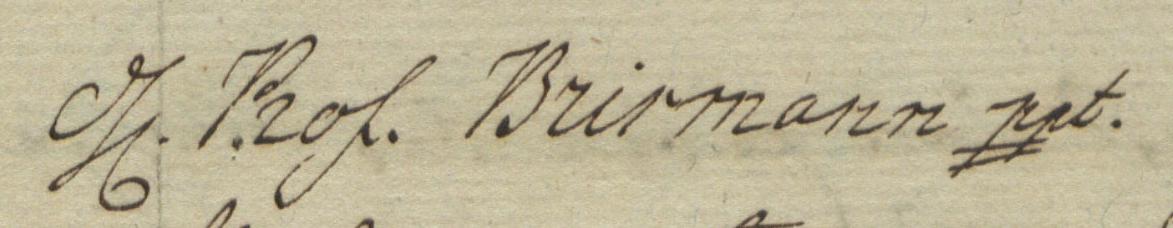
dh. Prof. Brismann ppt.
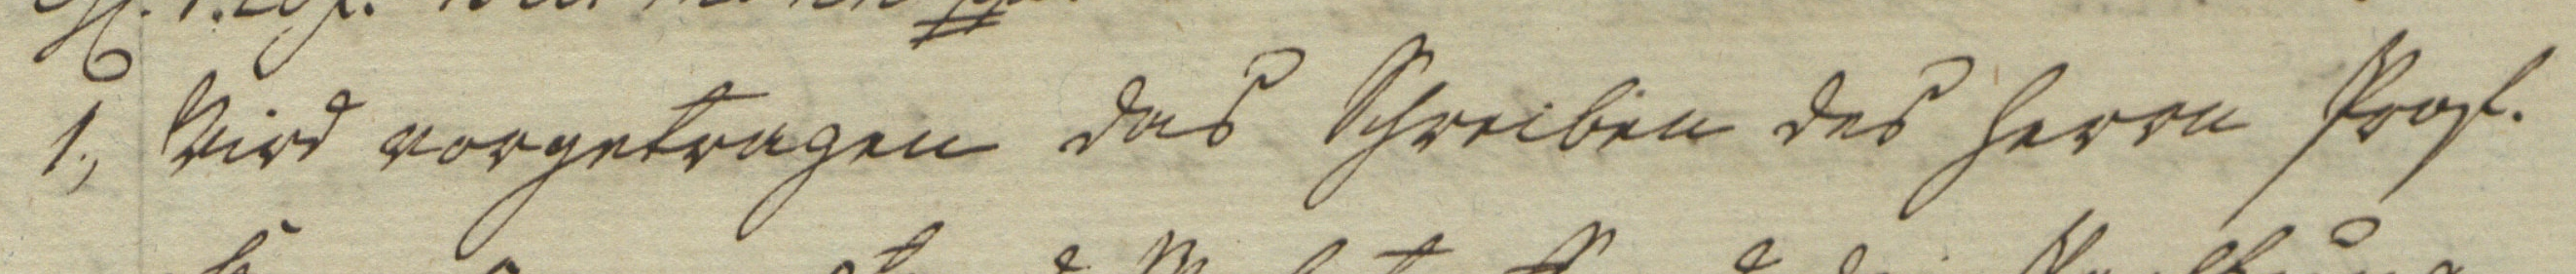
1., Wird vorgetragen das Schreiben des Herrn Prof.
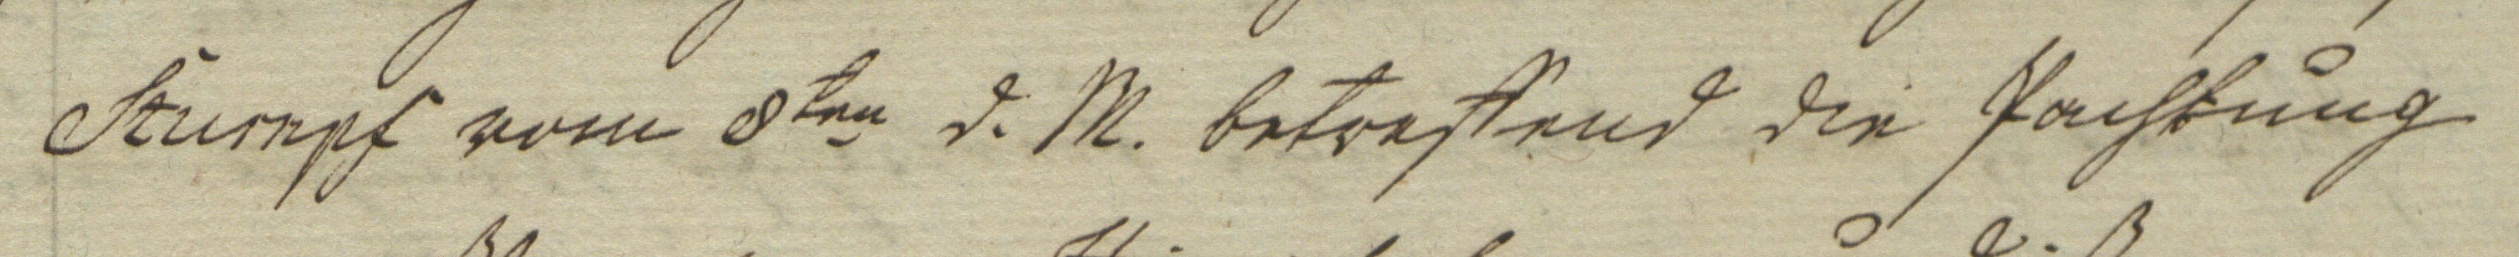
Stumpf vom 8 ten d. M. betreffend die Pachtung
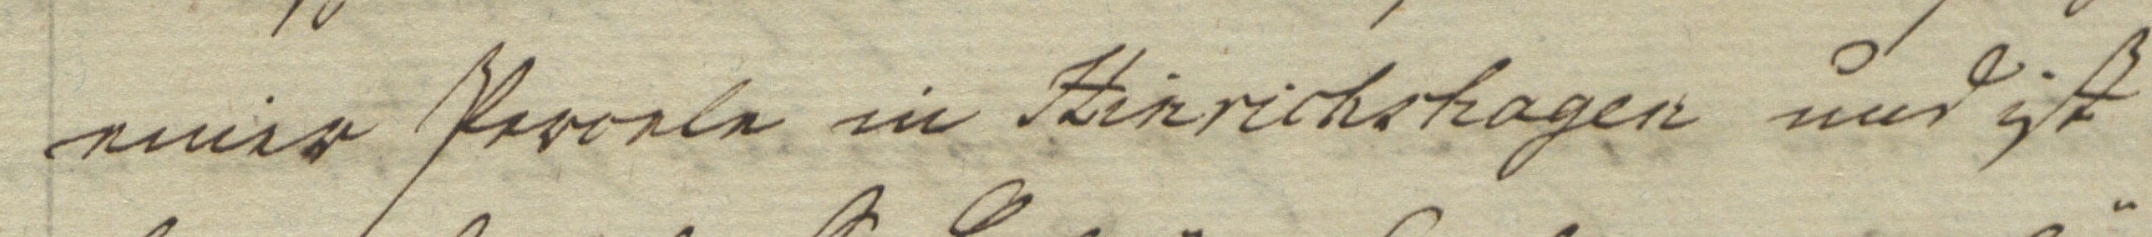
einer Percele in Hinrichshagen und ist
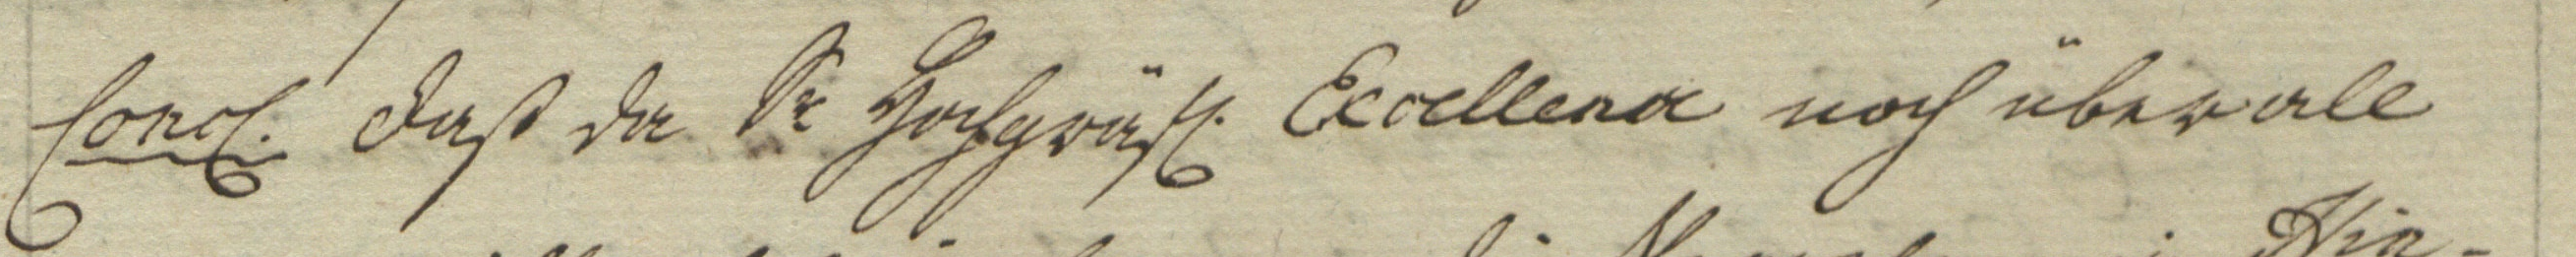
Concl. Daß da Sr Hochgräfl. Excellence noch überall
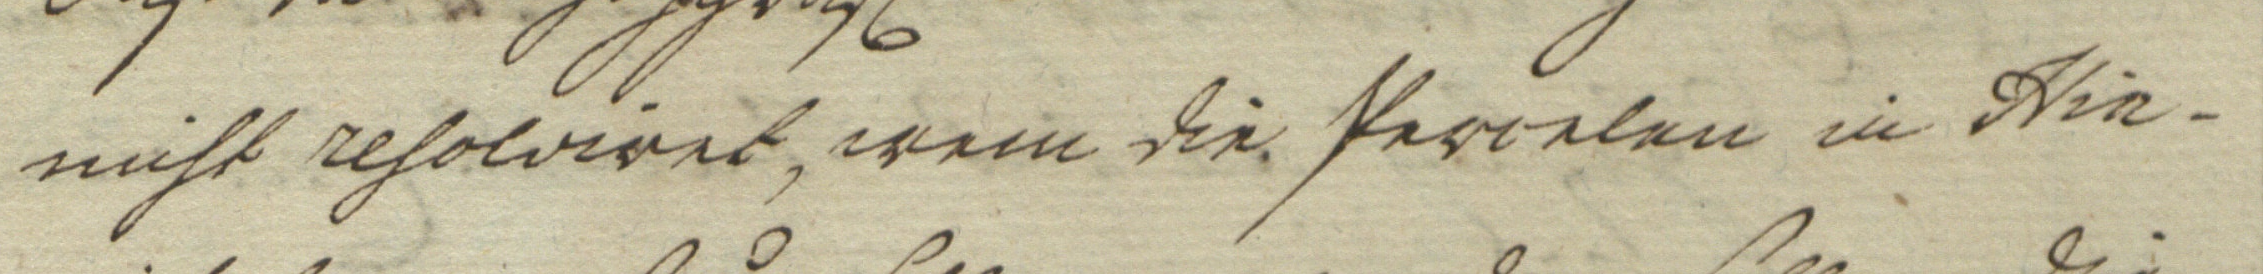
nicht resolviret, wem die Percelen in Hin¬
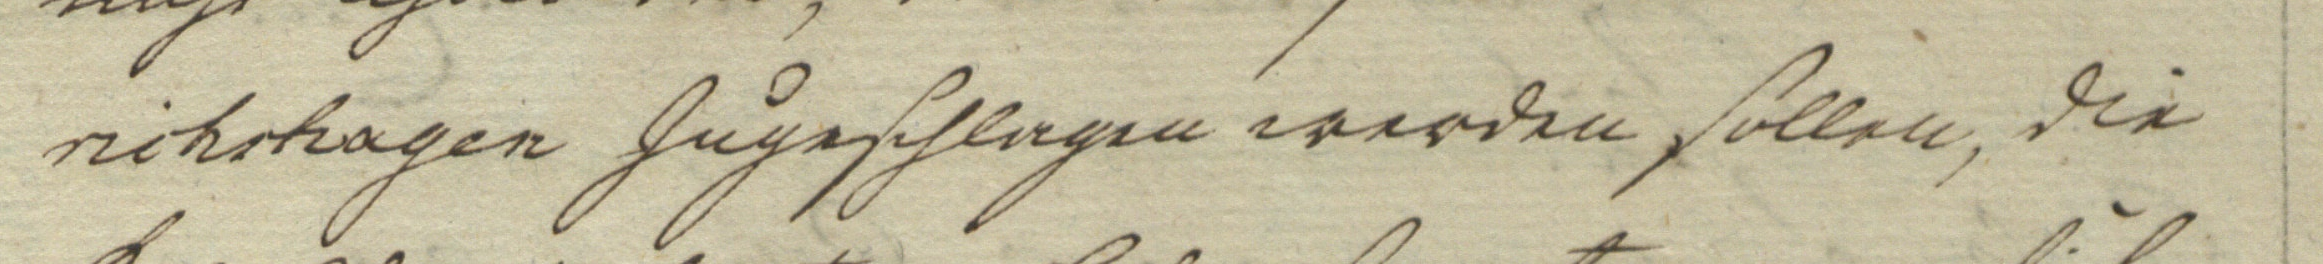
richshagen zugeschlagen werden sollen, die
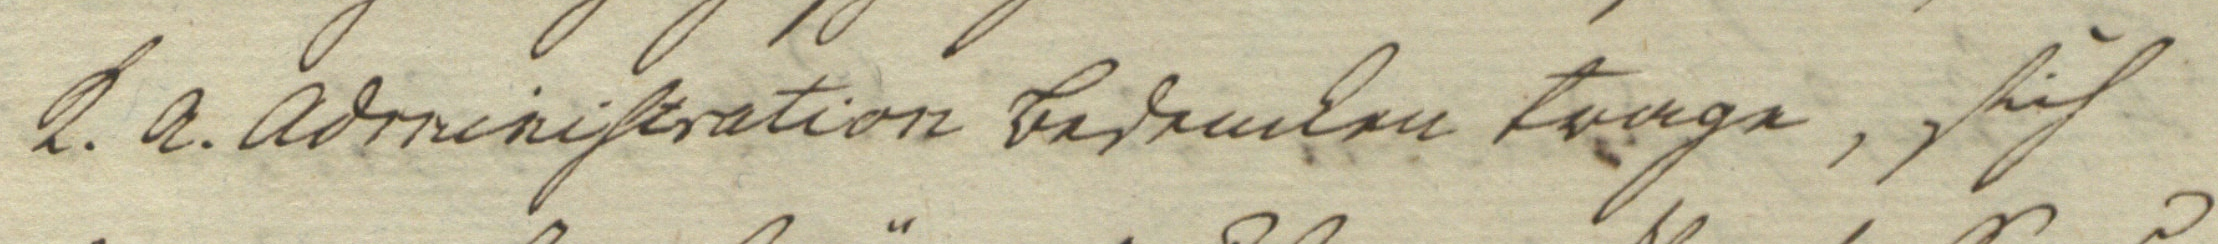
K. A. Administration Bedencken trage, sich
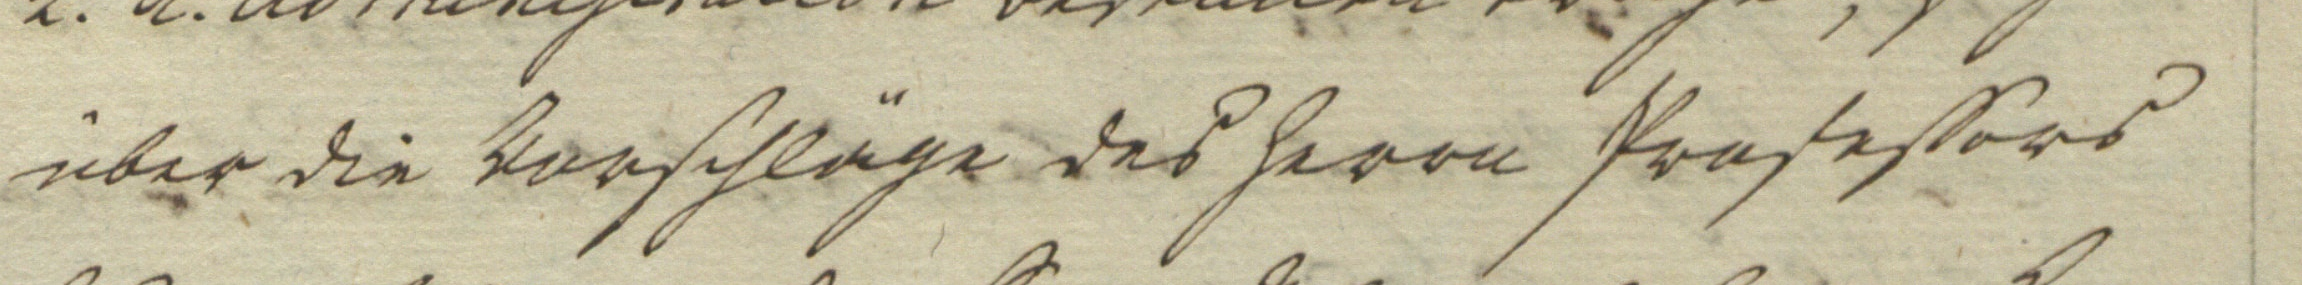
über die Vorschläge des Herrn Professors
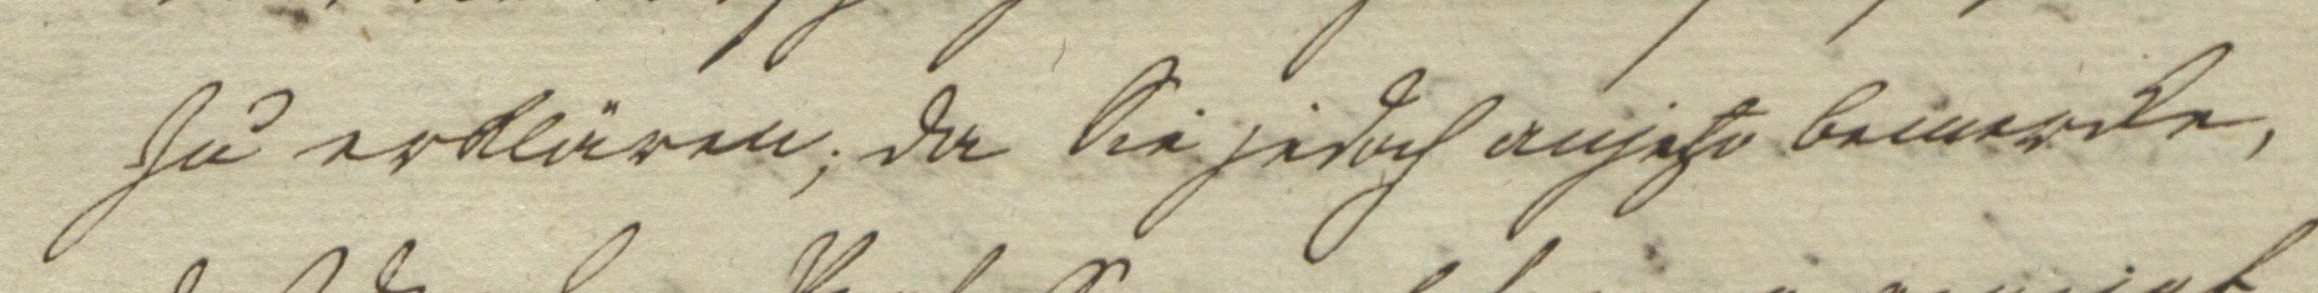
zu erklären; da Sie jedoch anjetzo bemercke,
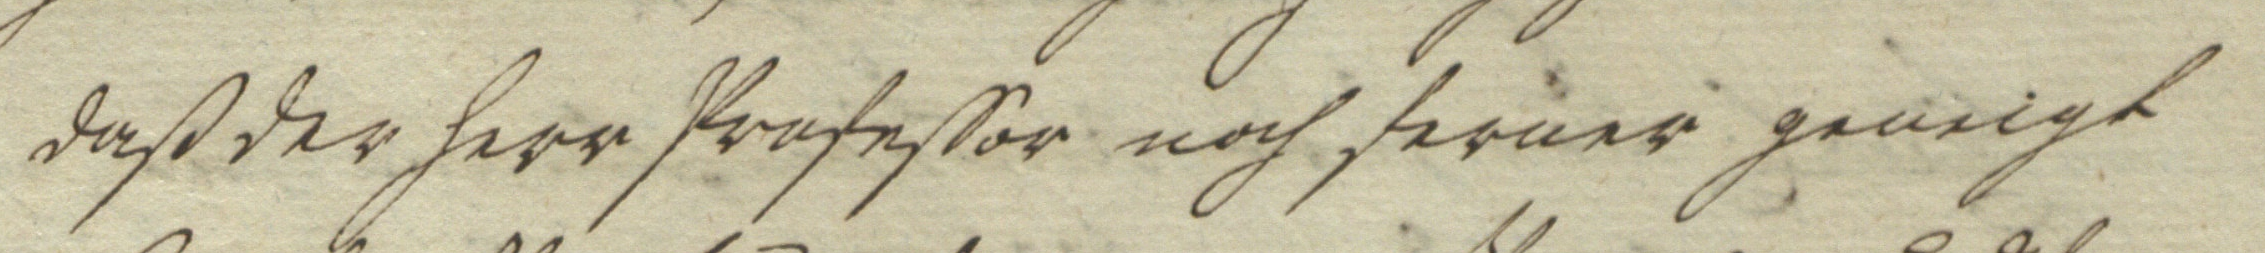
daß der Herr Professor noch ferner geneigt
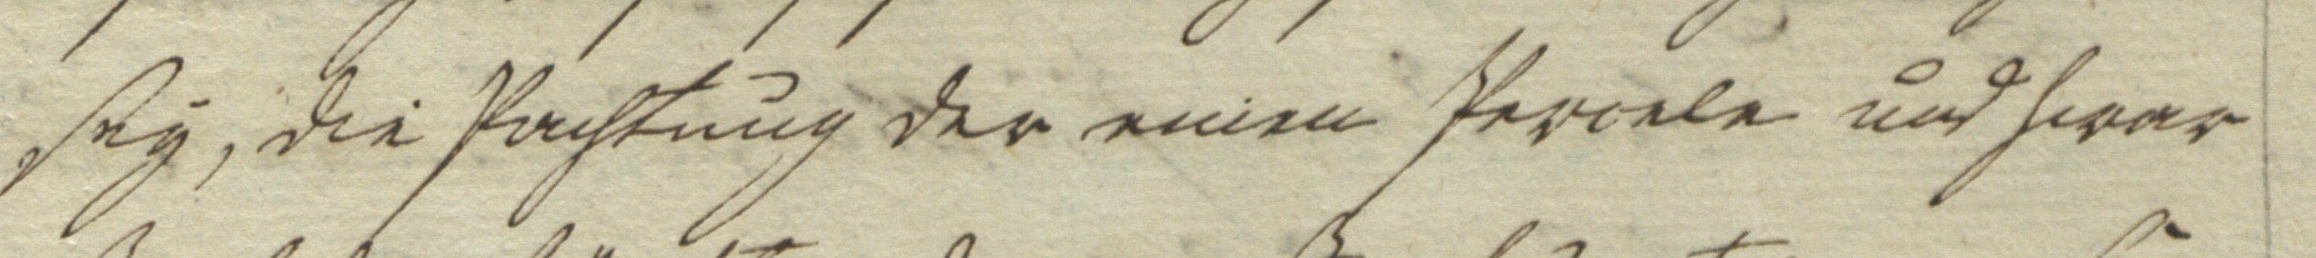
seÿ, die Pachtung der einen Percele und zwar
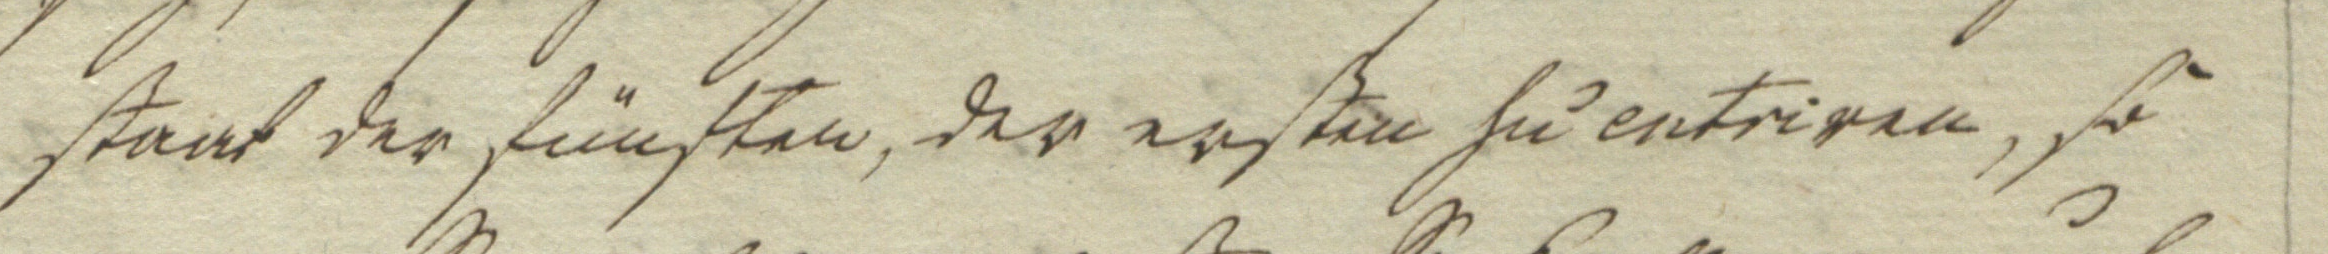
staat der fünften, der ersten zu entriren, so
